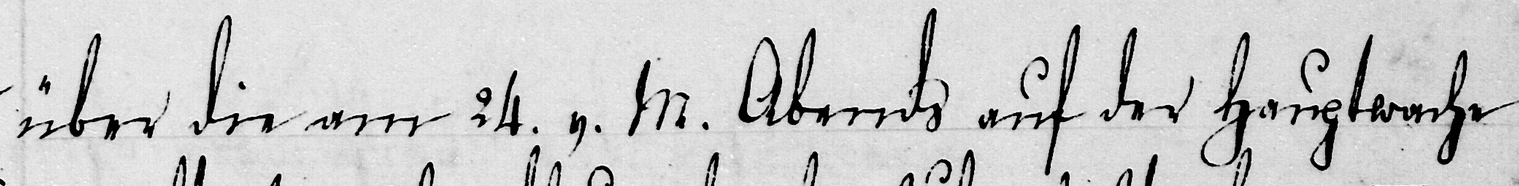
über die am 24. v. M. Abends auf der Hauptwache
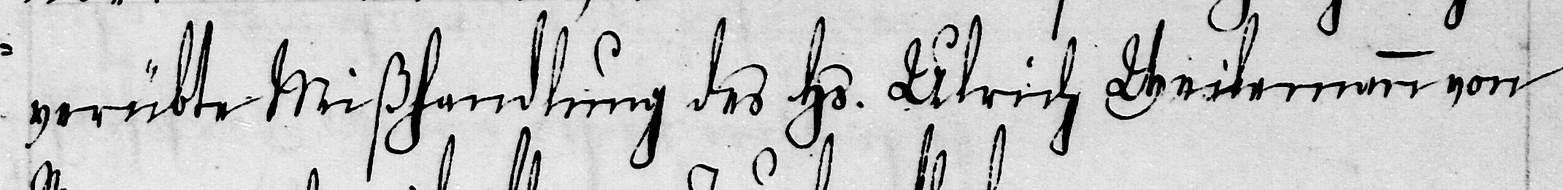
verübte Mißhandlung des Hs. Ulrich Weilemann von
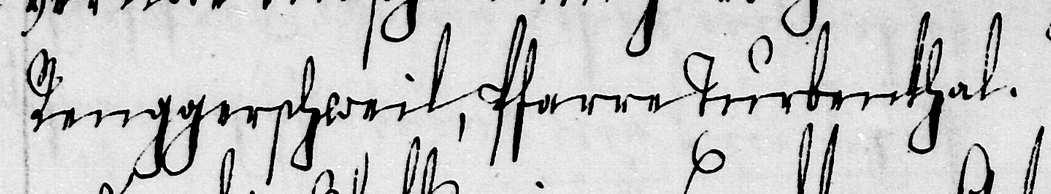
Renggerschweil, Pfarre Turbenthal.
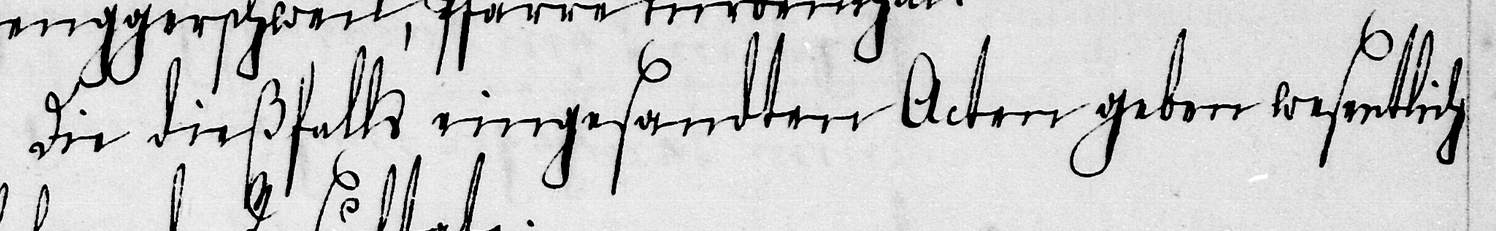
Die dießfalls eingesandten Acten geben wesentlich
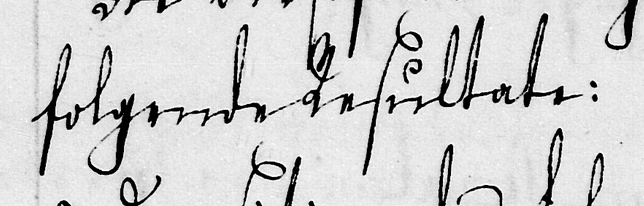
folgende Resultate:
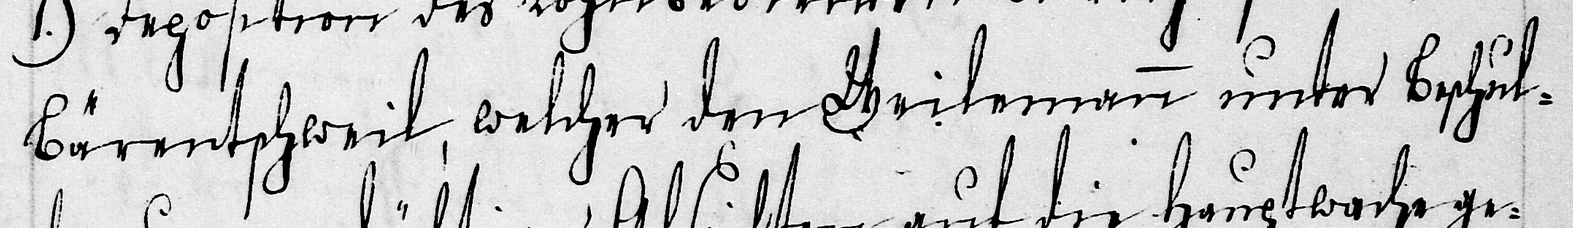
Bärentschweil, welcher den Weilemann unter Beschul¬
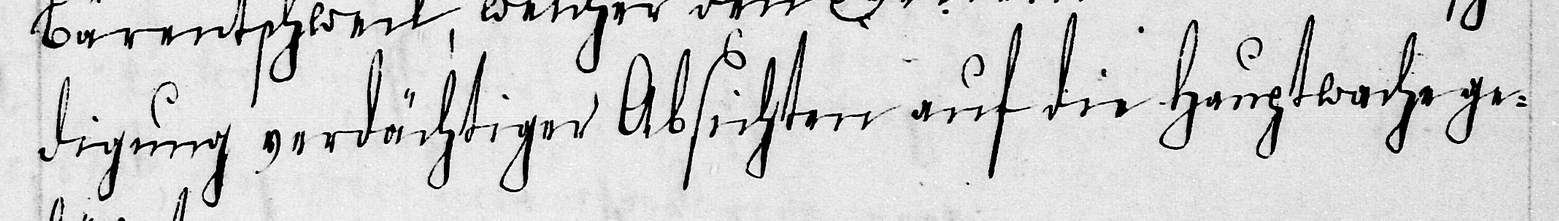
digung verdächtiger Absichten auf die Hauptwache ge¬
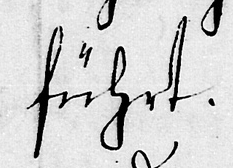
führt.
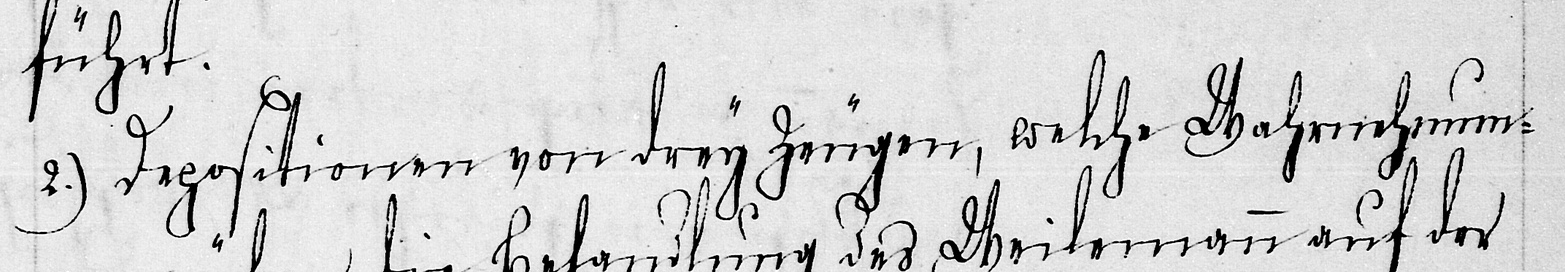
2.) Depositionen von drey Zeugen, welche Wahrnehmun¬
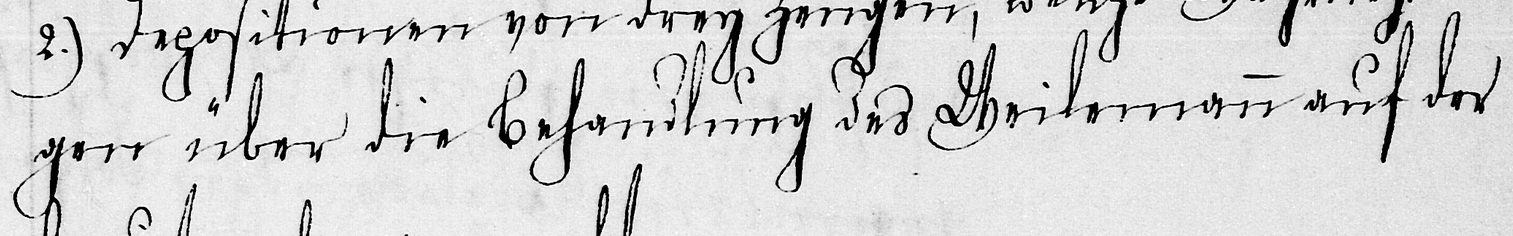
gen über die Behandlung des Weilemann auf der
